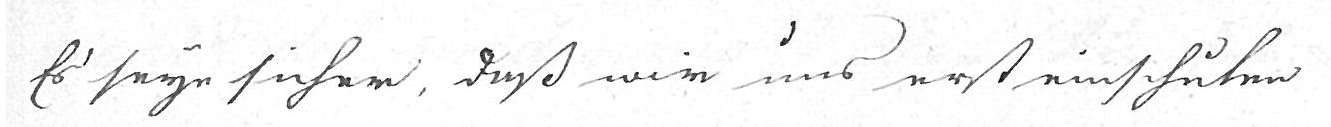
Es seye sicher, daß wir uns erst einschulen
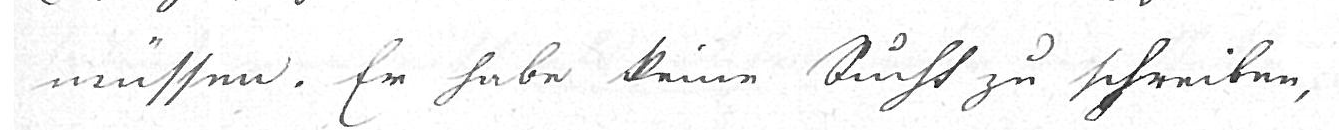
müssen. Er habe keine Sucht zu schreiben,
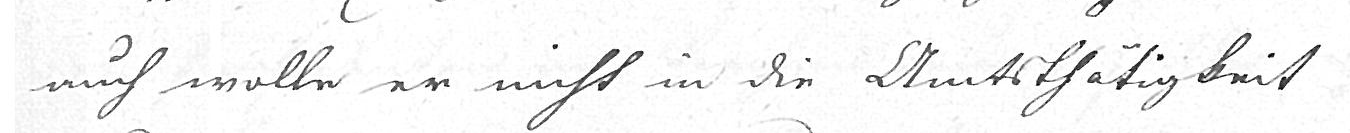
auch wolle er nicht in die Amtsthätigkeit
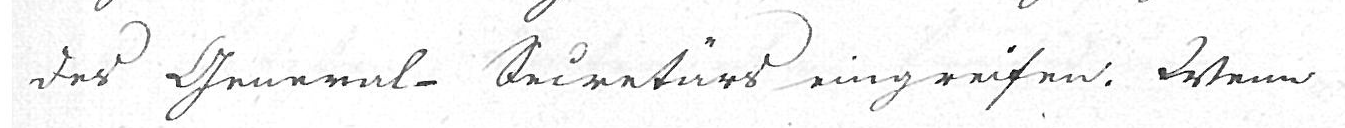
des General-Secretärs eingreifen. Wenn
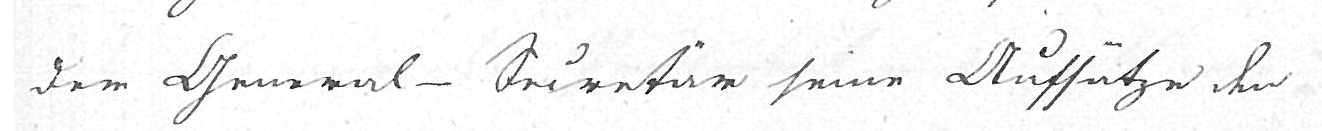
der General-Secretär seine Aufsätze den
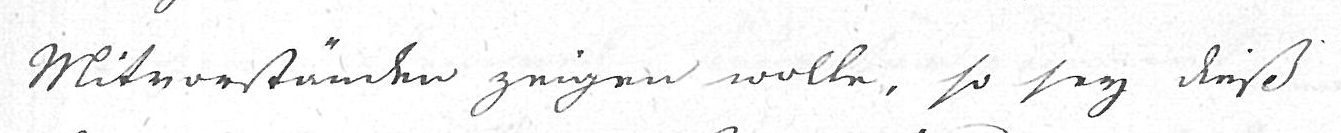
Mitvorständen zeigen wolle, so sey dieß
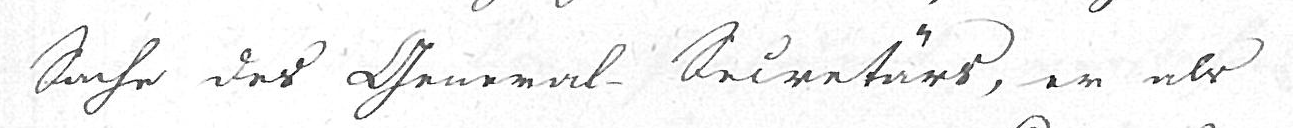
Sache des General-Secretärs, er als
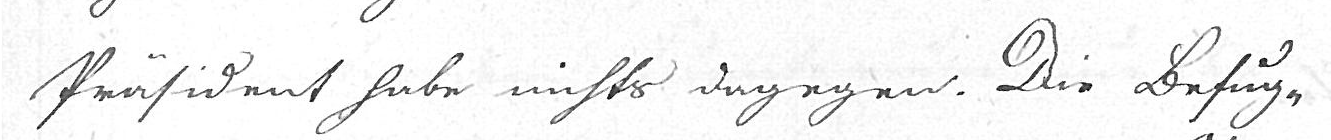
Präsident habe nichts dagegen. Die Befug-
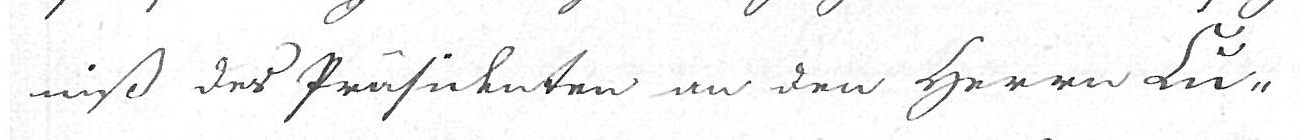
niß des präsidenten an den Herrn Cu-
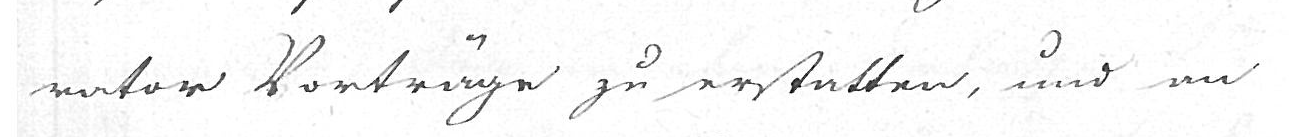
rator Vorträge zu erstatten, und an
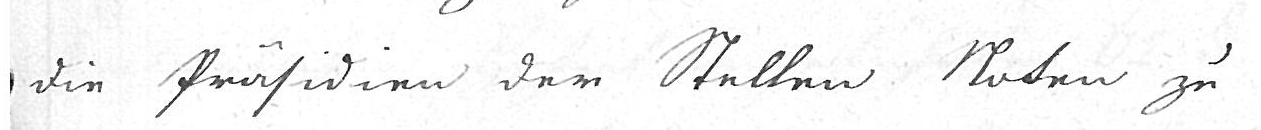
die Präsidien der Stellen Noten zu
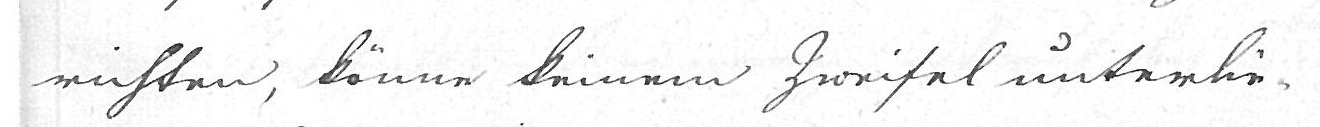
richten, könne keinem Zweifel unterlie-
